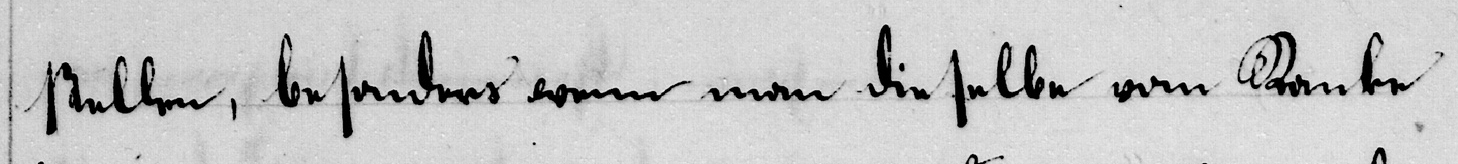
stellen, besonders wenn man dieselbe vom Ranke
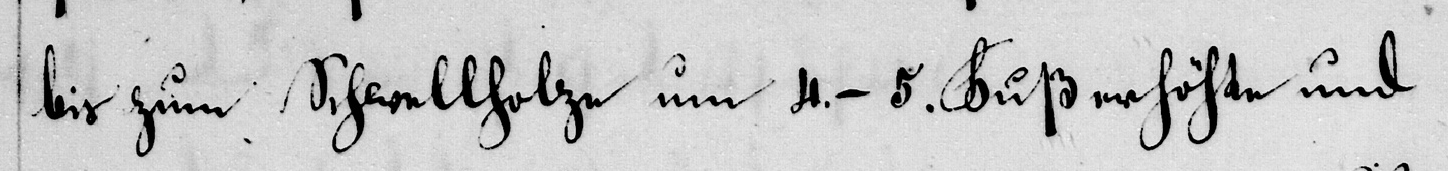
bis zum Schwellholze um 4.–5. Fuß erhöhte und
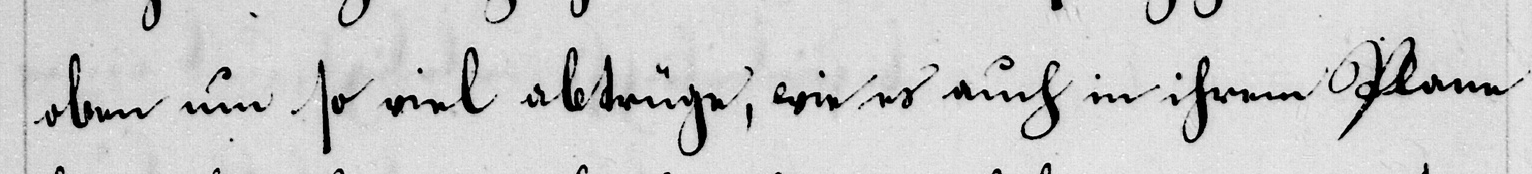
oben um so viel abtrüge, wie es auch in ihrem Plane
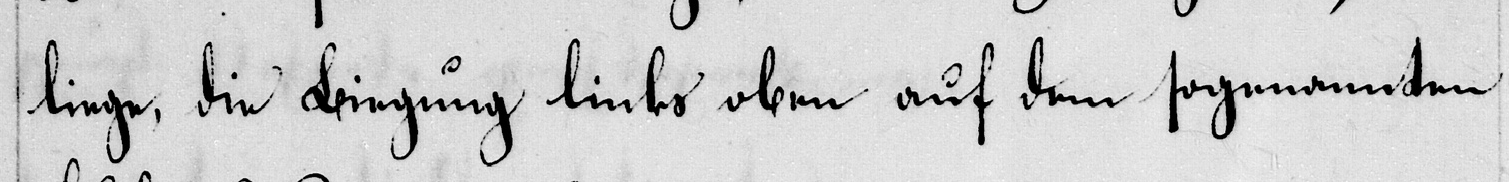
liege, die Biegung links oben auf dem sogenannten
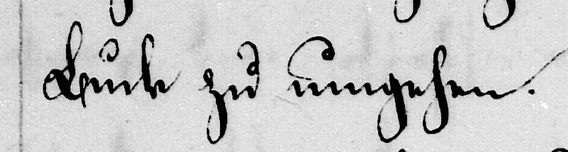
Buck zu umgehen.
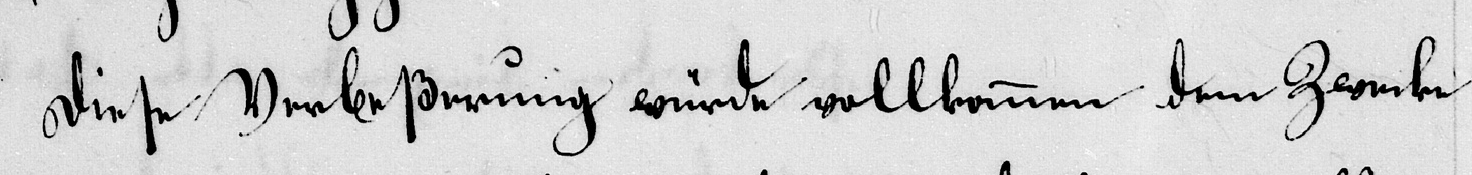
Diese Verbeßerung würde vollkommen dem Zwecke
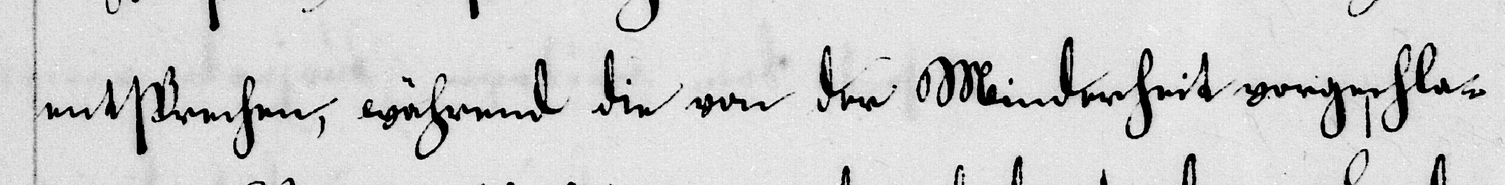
entsprechen, während die von der Minderheit vorgeschla¬
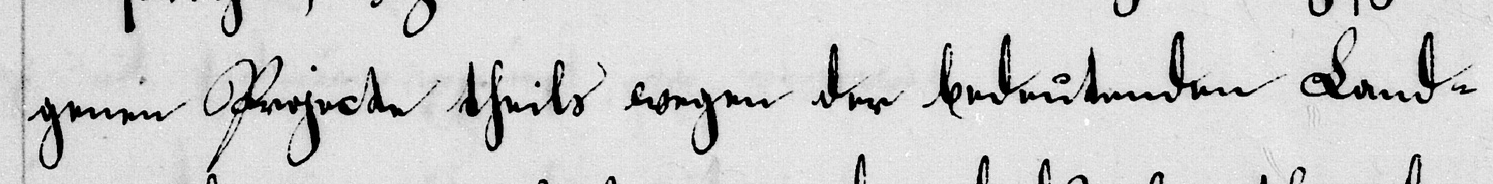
genen Projecte theils wegen der bedeutenden Land¬
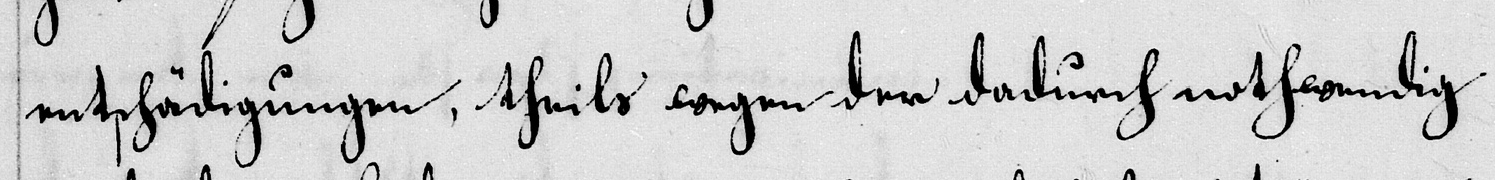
entschädigungen, theils wegen der dadurch nothwendig
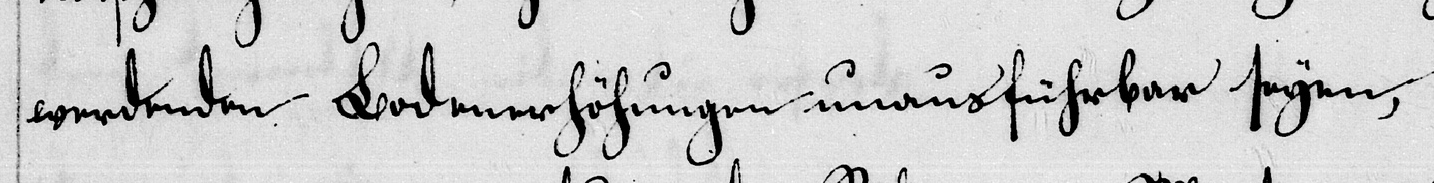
werdenden Bodenerhöhungen unausführbar seyen,
